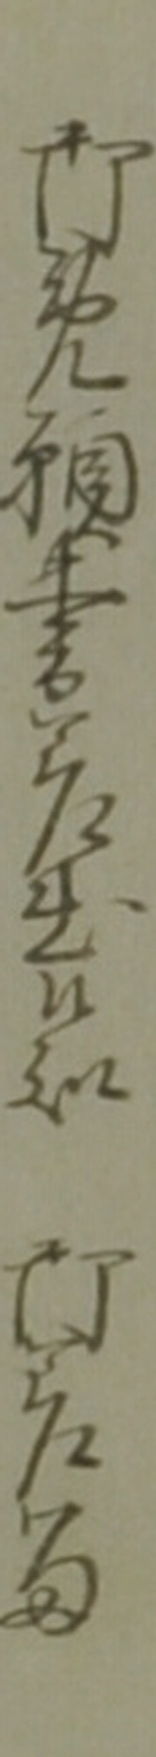御免願書差出候処御差留
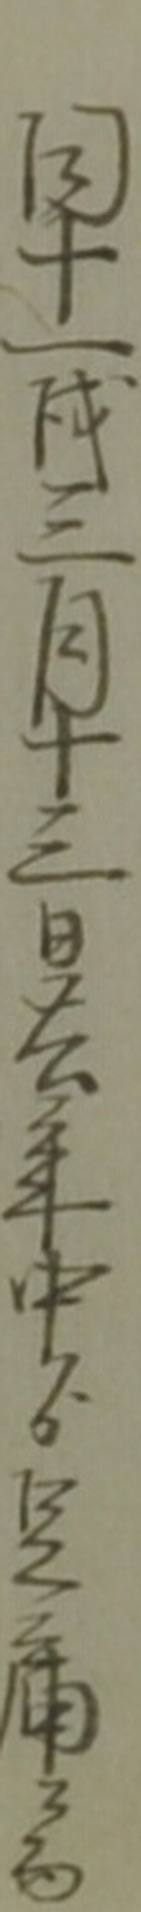一同十一戌三月十三日去年中ゟ足痛ニ而
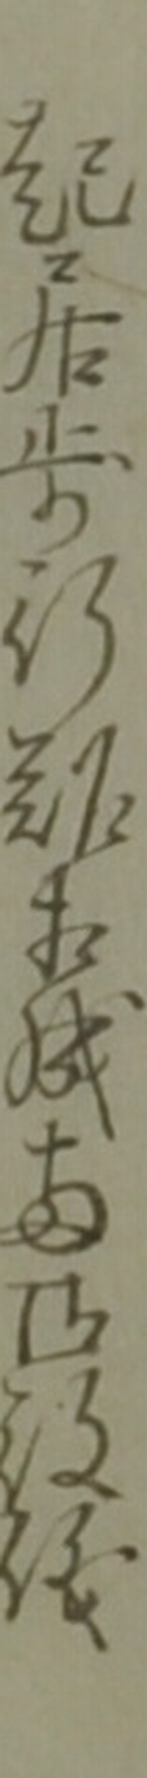起居歩行難相成両御役儀
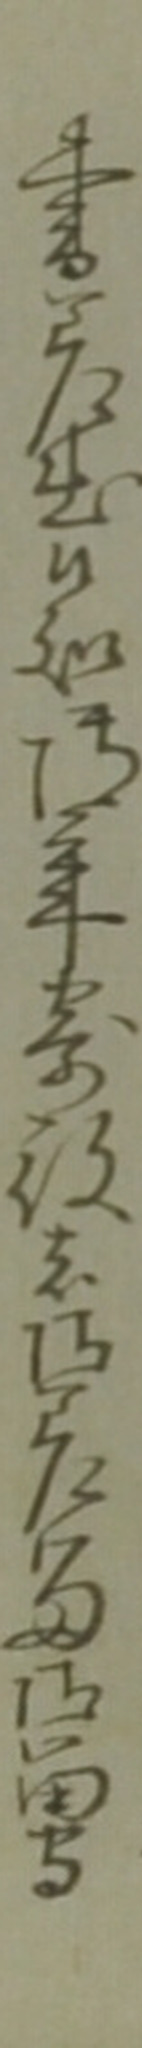書差出候処御年寄役者御差留御留守
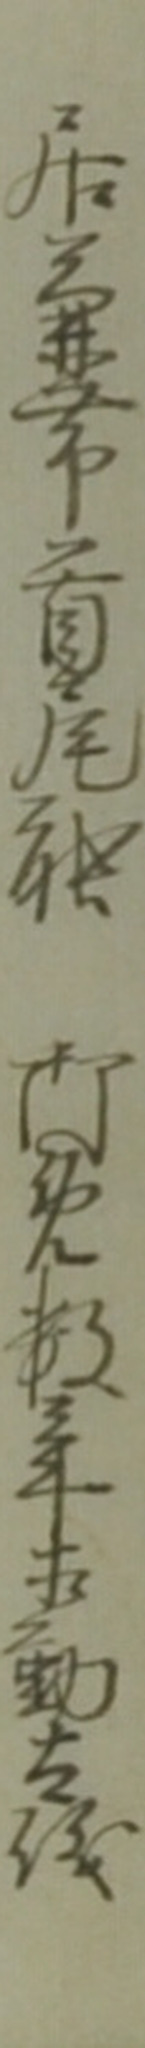居兼帯首尾能御免数年相勤太儀
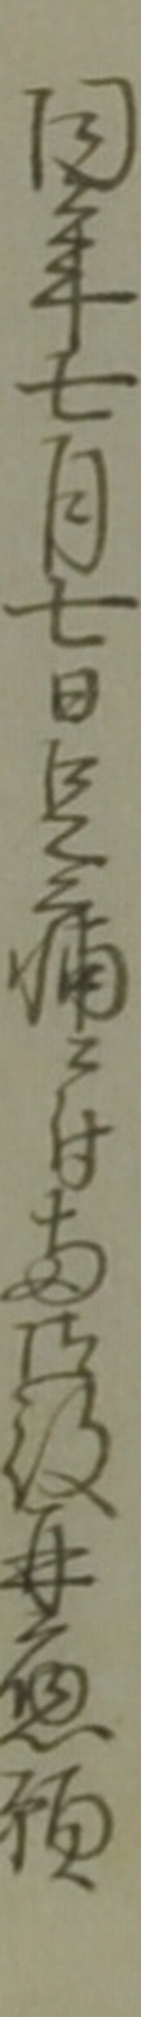一同年七月七日足痛ニ付両御役再応願
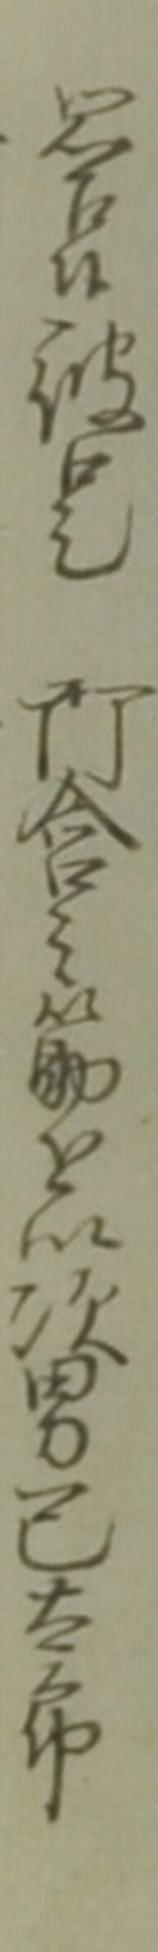思召候彼是御含之筋を以次男己太郎

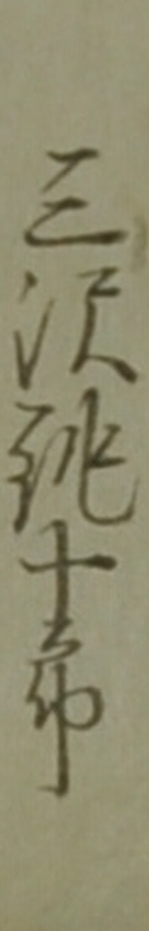三沢銚十郎
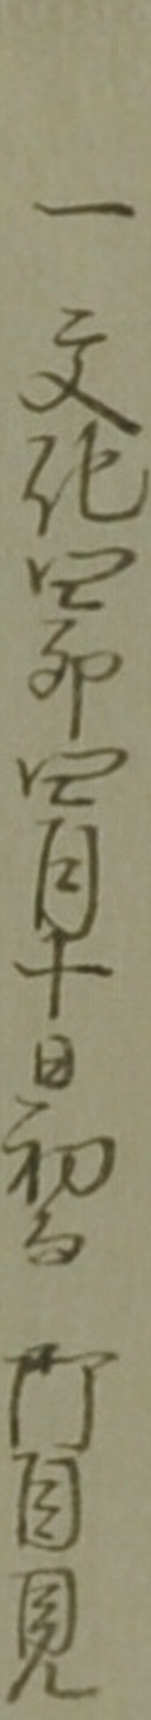一文化四卯四月十日初而御目見
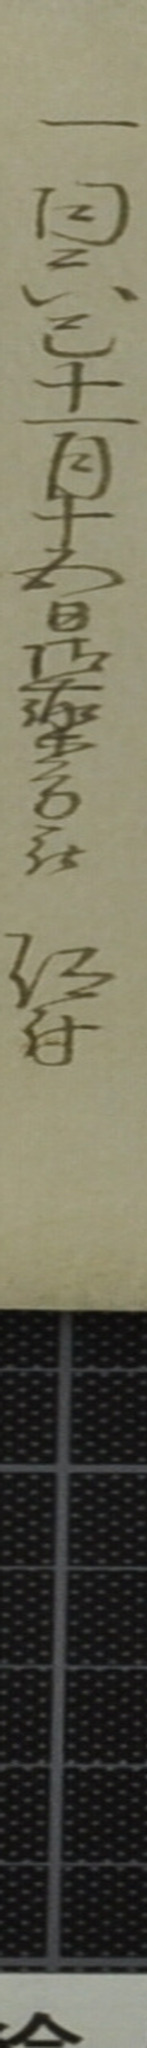一同六巳十一月十五日御薬方被仰付
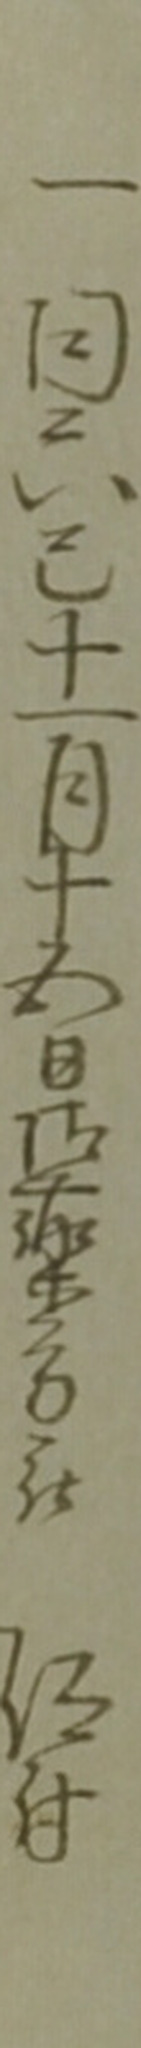一同六巳十一月十五日御薬方被仰付
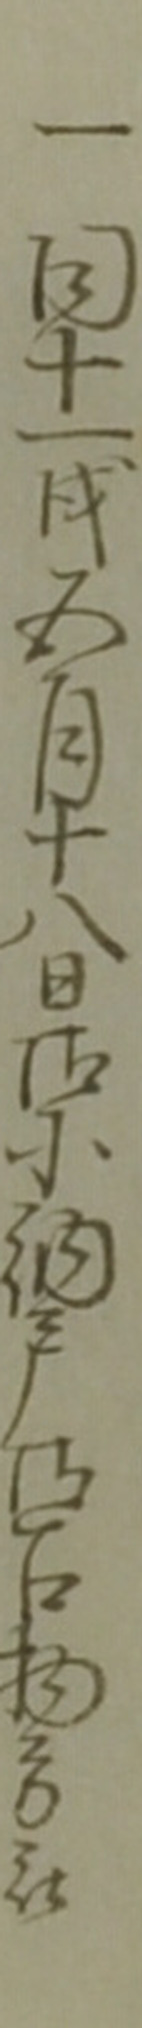一同十一戌五月十八日御小納戸御召物方被
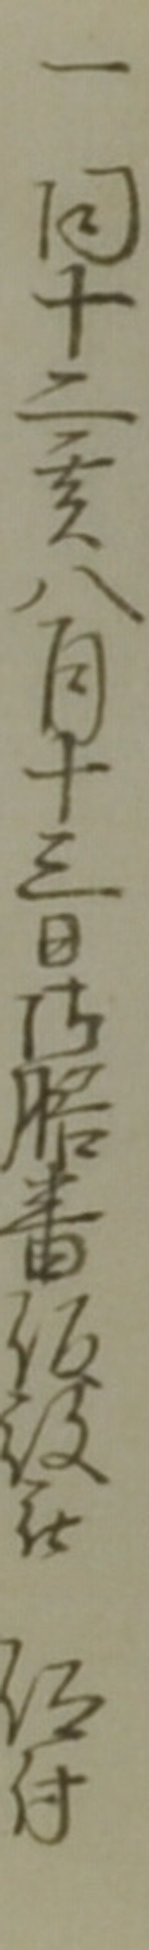一同十二亥八月十三日御膳番仮役被仰付
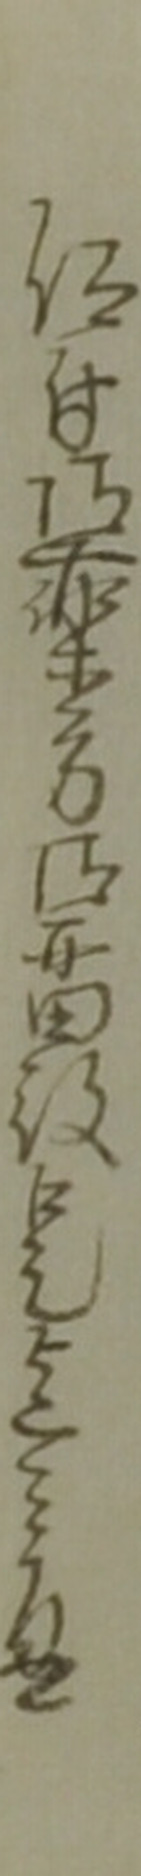仰付御薬方御番役是迄之通
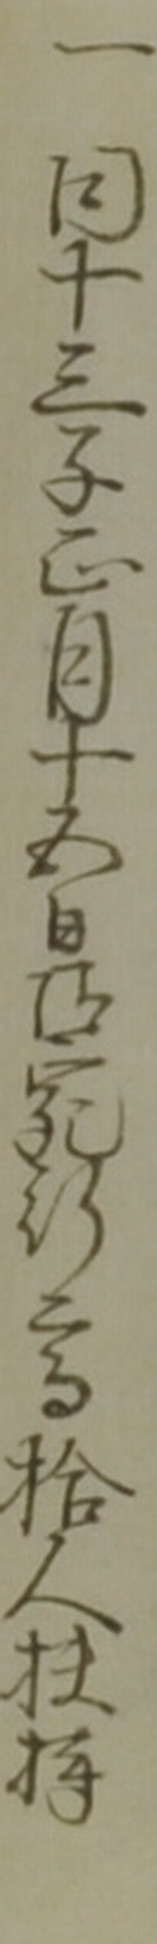一同十三子正月十五日御宛行高拾人扶持
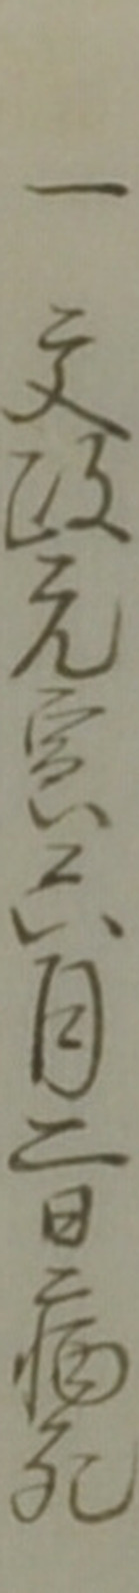一文政元寅六月二日病死
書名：給人諸士勤仕録（三）
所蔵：伊那市立高遠町図書館・合同会社AMANE
